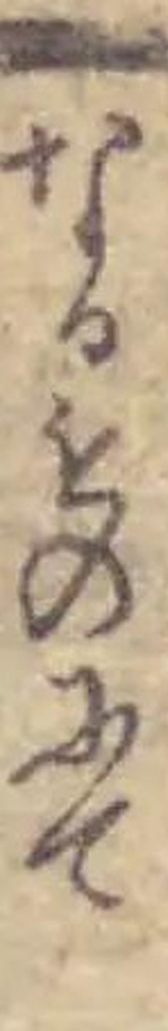なるものにて
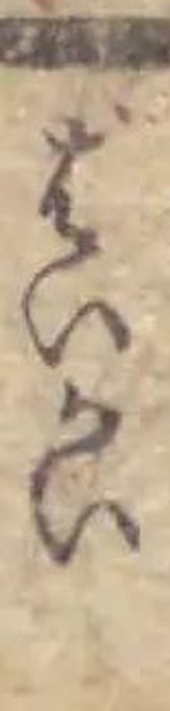はいかい
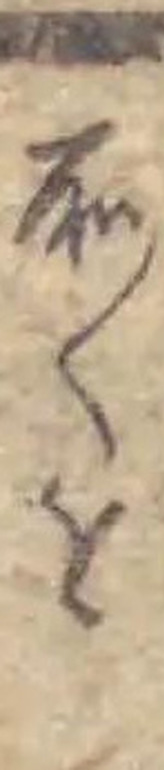所〳〵を
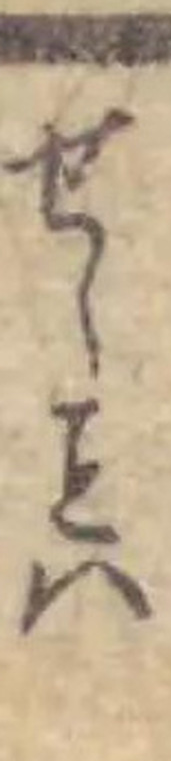せしことハ
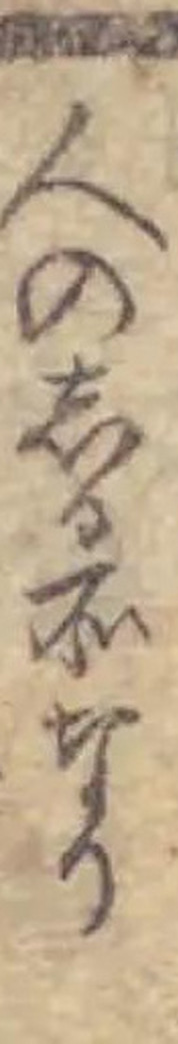人のしる所なり
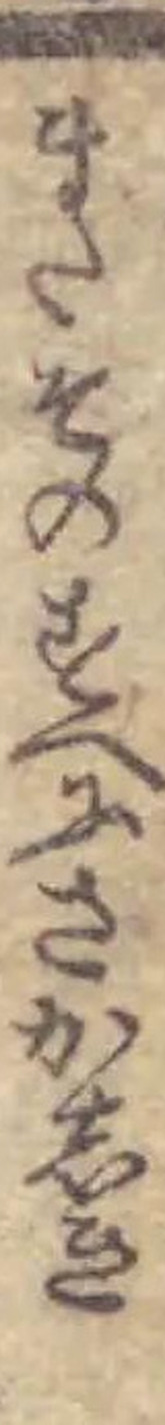またそのすへにさかしき
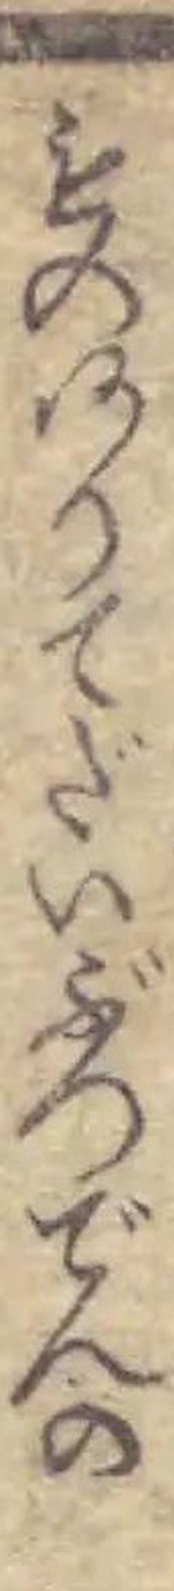ものありてだいぶつでんの
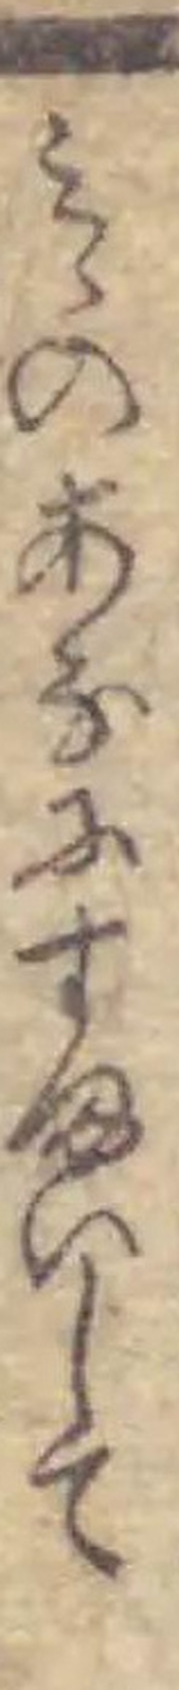ミヽのあなにすまいして
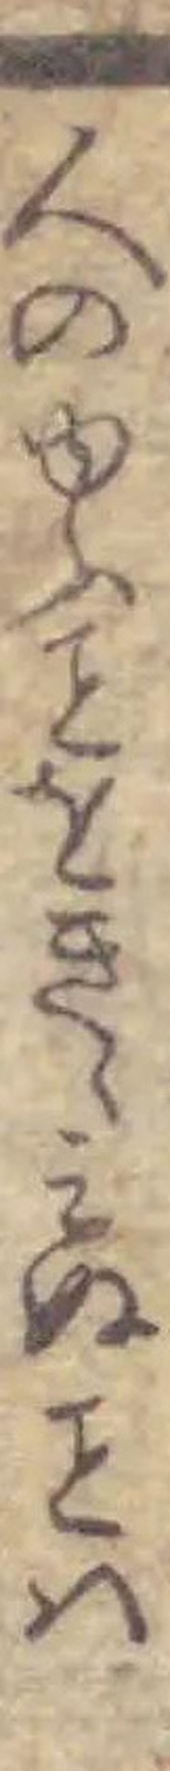人のゆふことをきゝえぬことハ
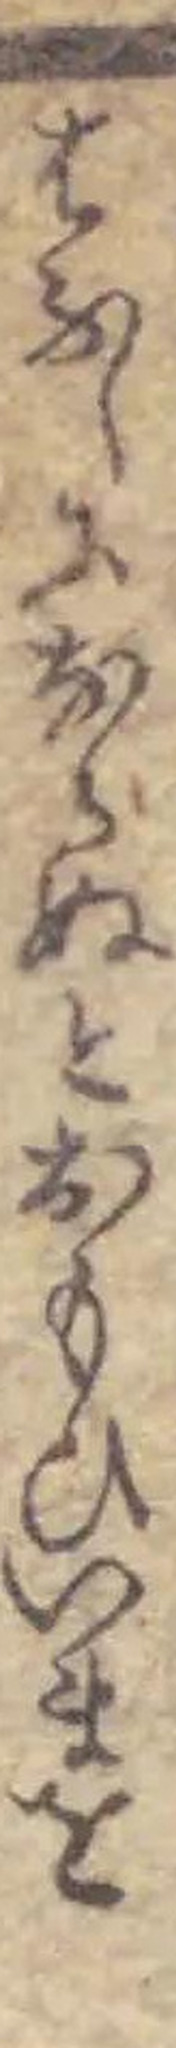はなしにならぬとおもひいまを
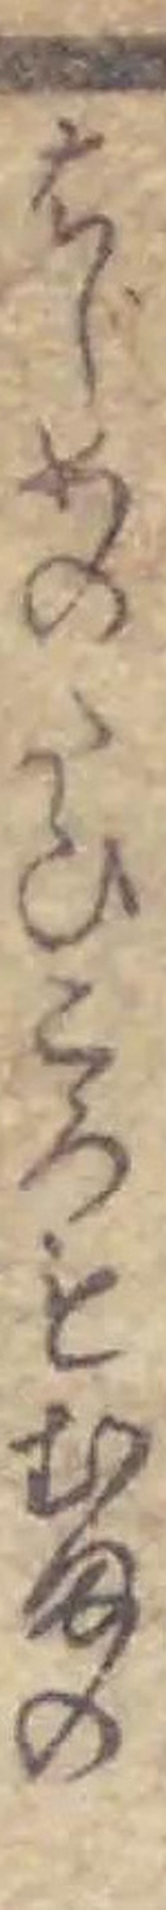はじめのたひころもむまの
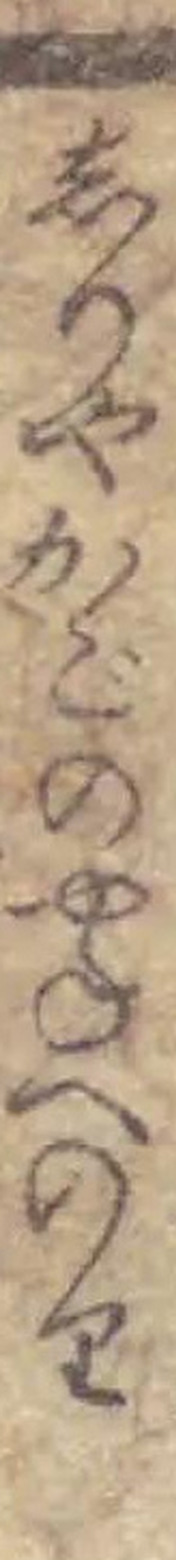しりやかごのやねへのり
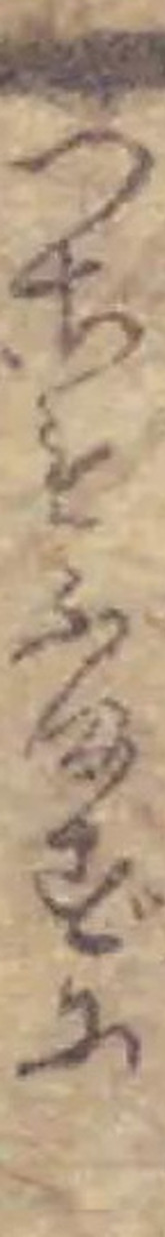つちもふまずに
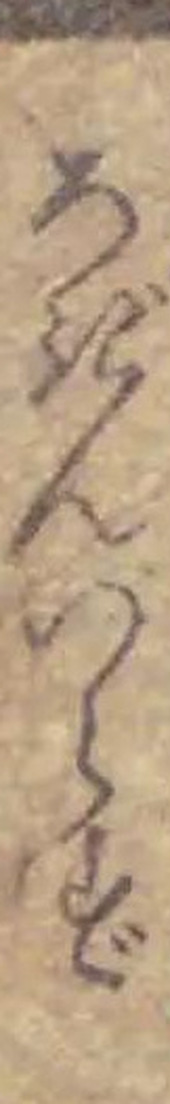ろぎんいらず
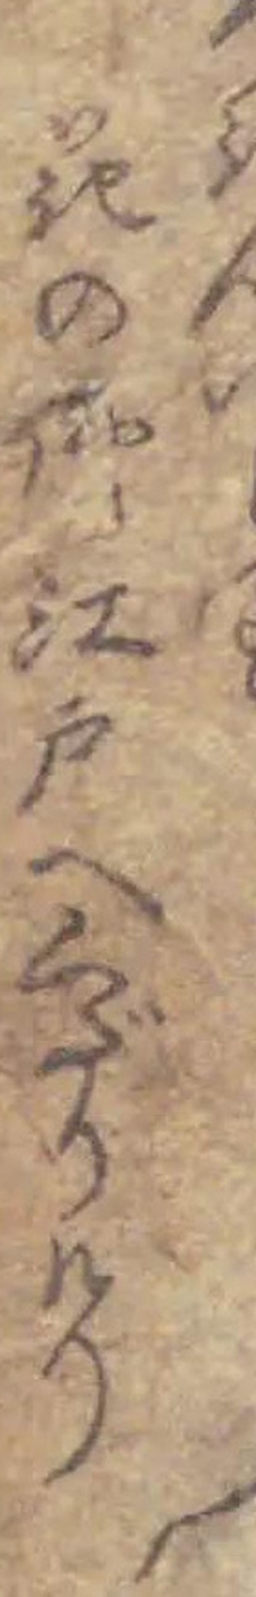花の御江戸へくだりけり

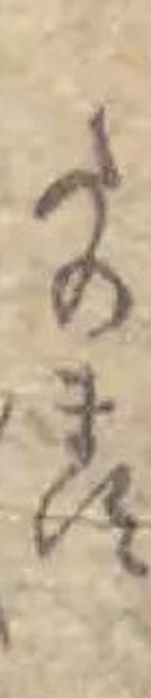たのます
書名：豆男江戸見物 2巻
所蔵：国立国会図書館 National Diet Library, JAPAN
